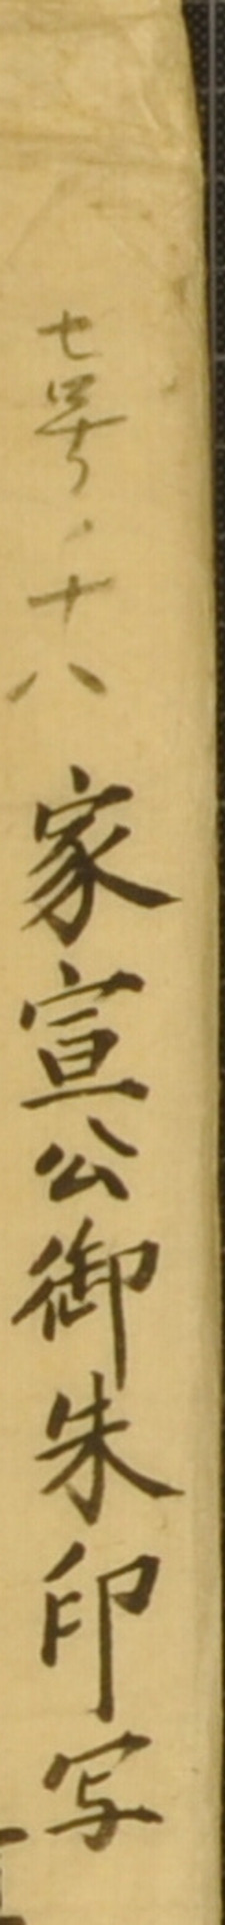七号ノ十八家宣公御朱印写
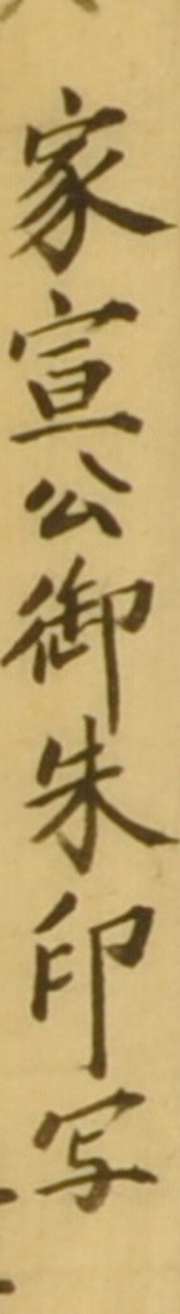家宣公御朱印写
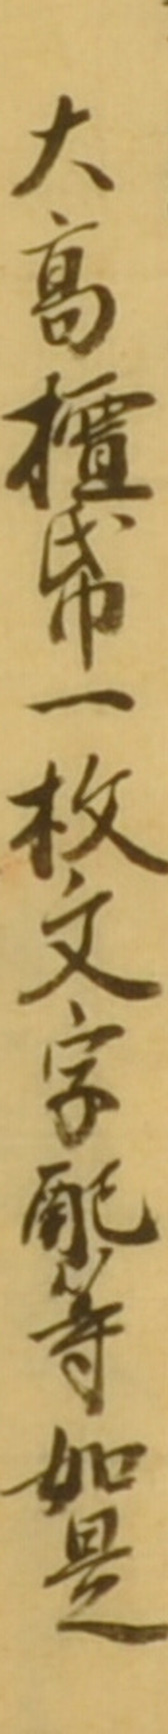五大高檀紙一枚文字配等如是
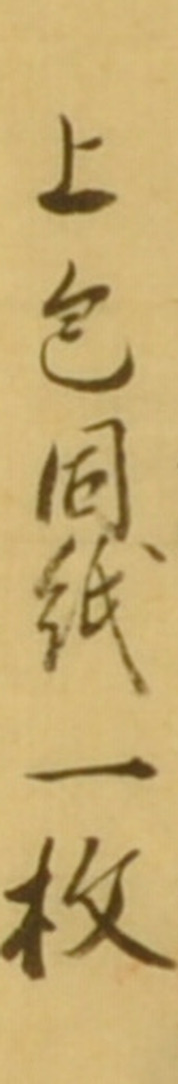上包同紙一枚
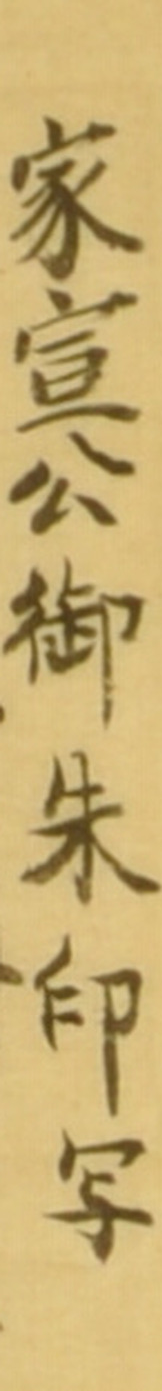家宣公御朱印写
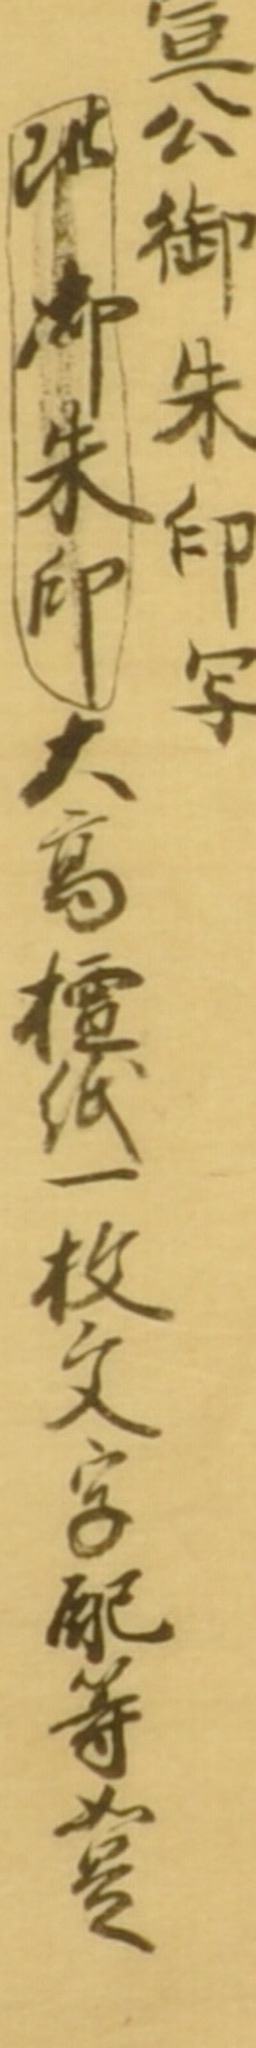此御朱印大高檀紙一枚文字配等如是
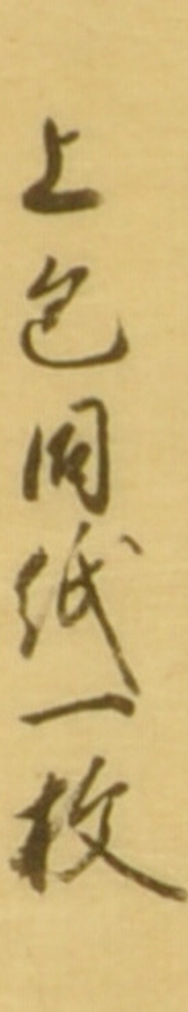上包同紙一枚

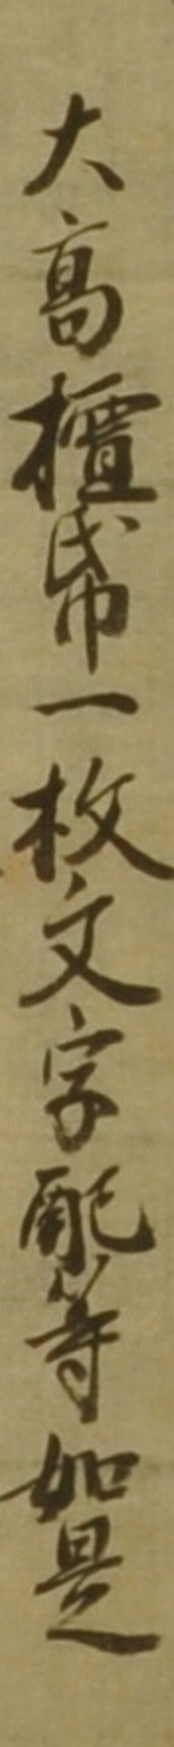五大高檀紙一枚文字配等如是
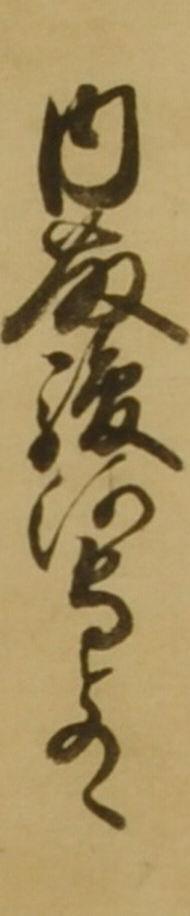内藤駿河守とのへ

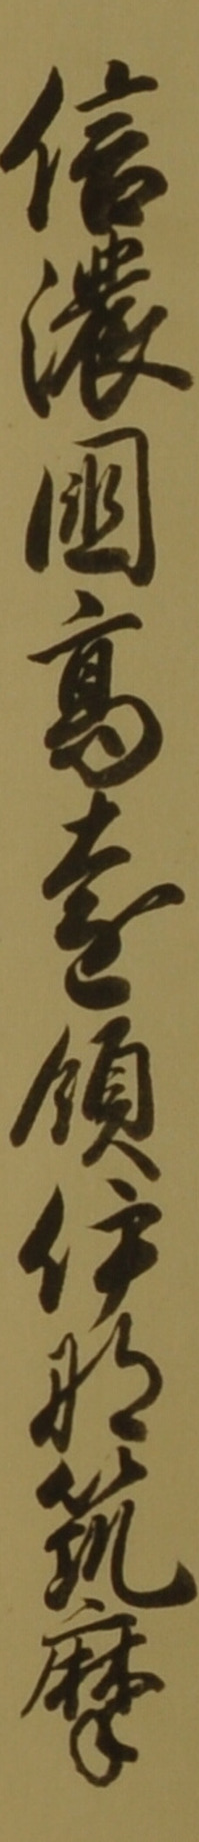信濃国高遠領伊那筑摩
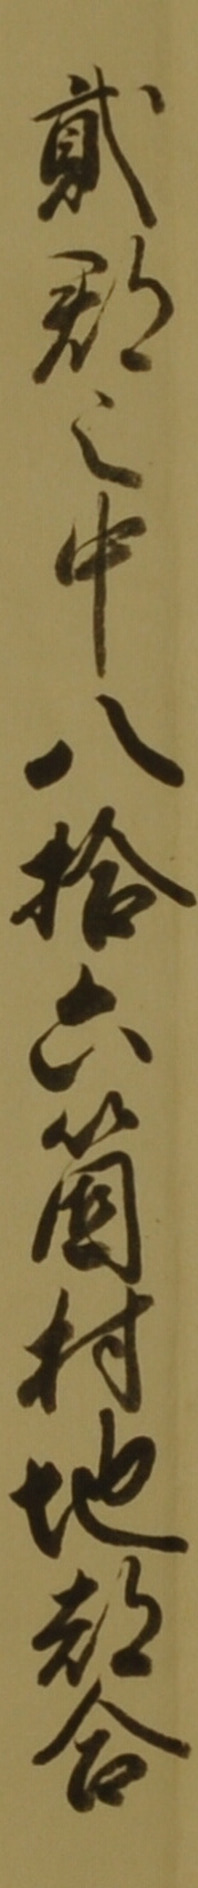貮郡之中八拾六箇村地都合
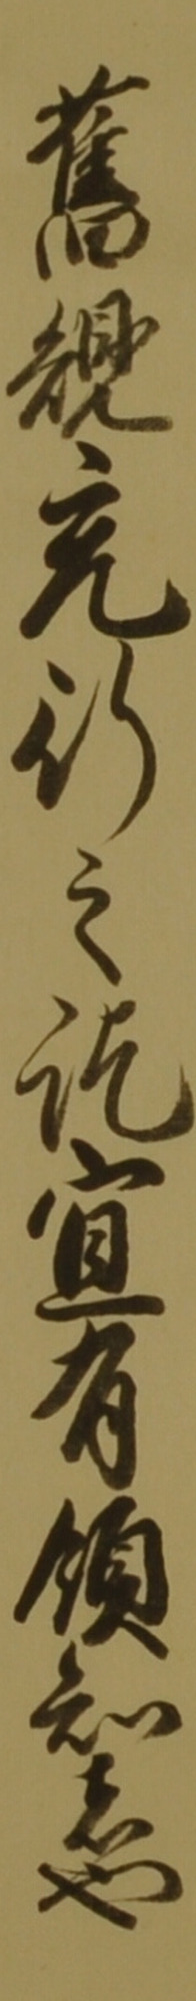旧規充行之訖宜有領知者也
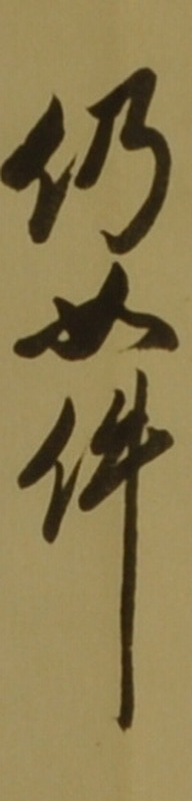仍如件
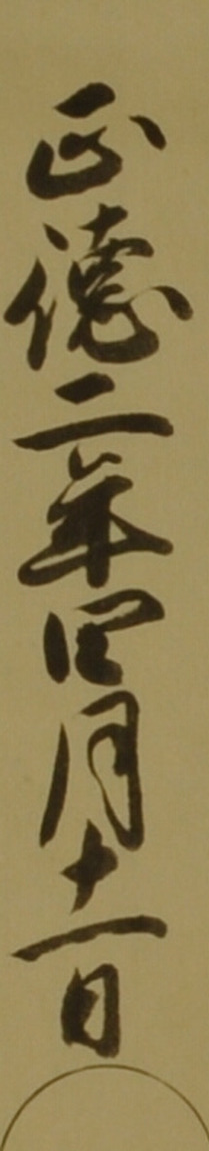正徳二年四月十一日
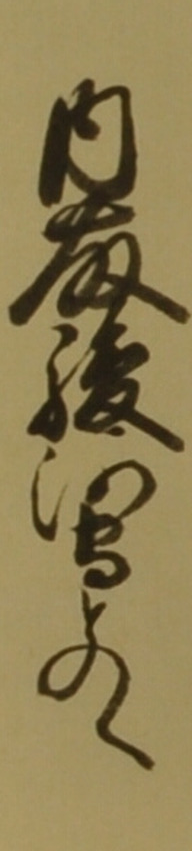内藤駿河守とのへ

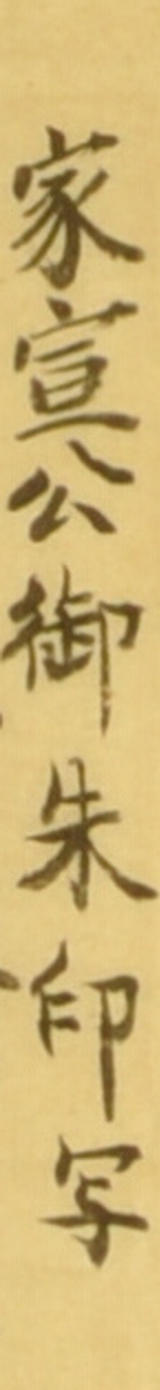家宣公御朱印写
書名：御朱印状〔写〕〔同文書二通一括〕
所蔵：伊那市立高遠町図書館・合同会社AMANE
